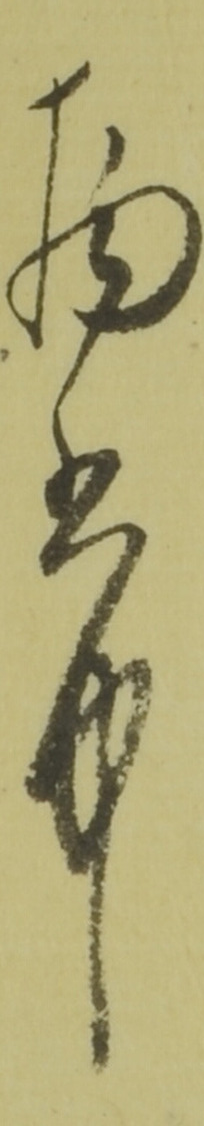物書中
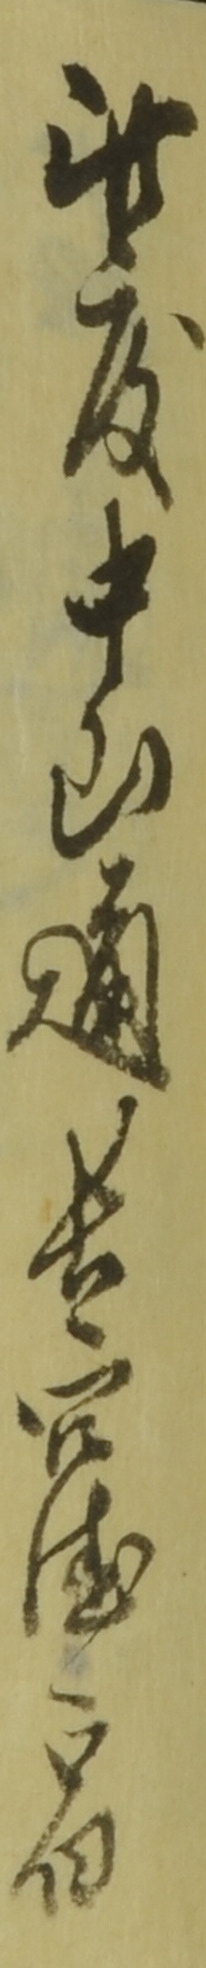此度中山道長窪宿
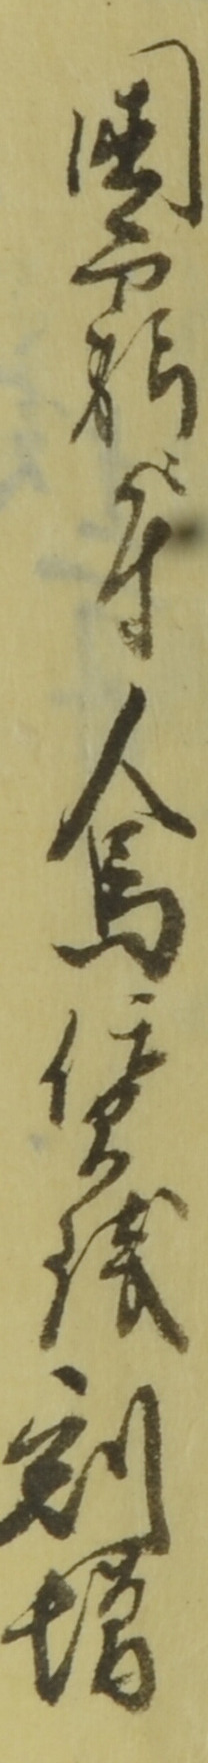困窮ニ付人馬賃銭割増

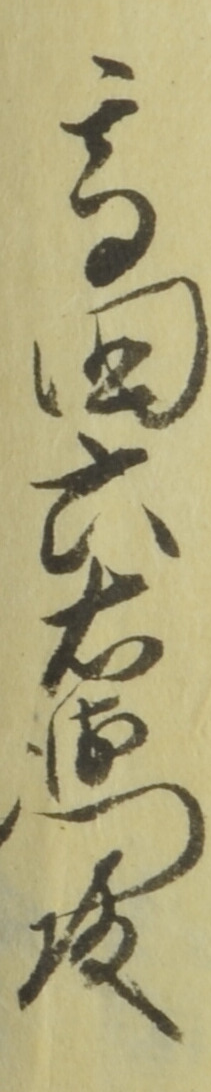高田六右衛門殿
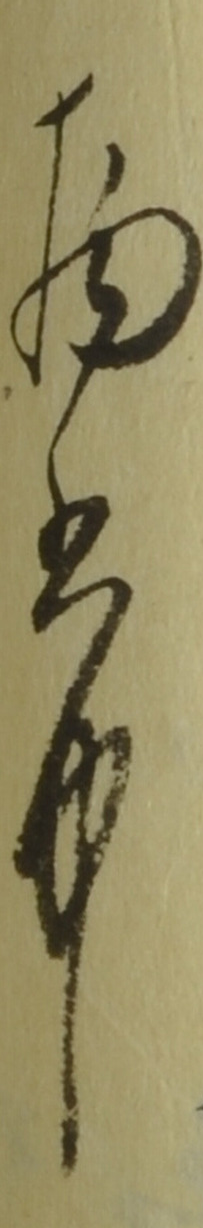物書中
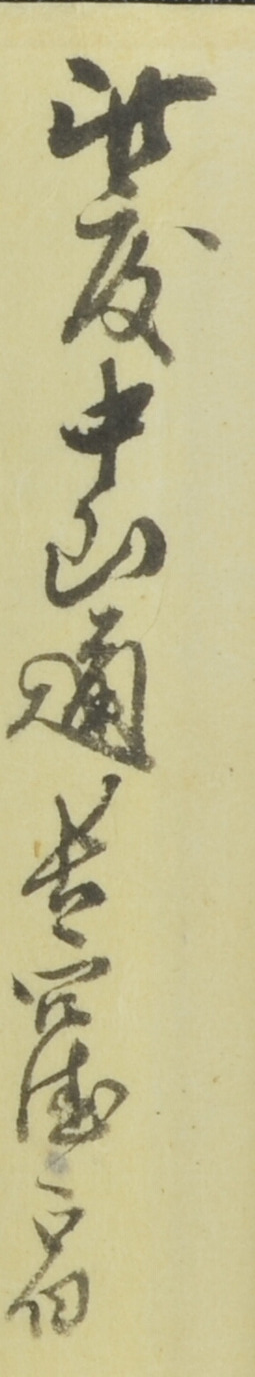此度中山道長窪宿
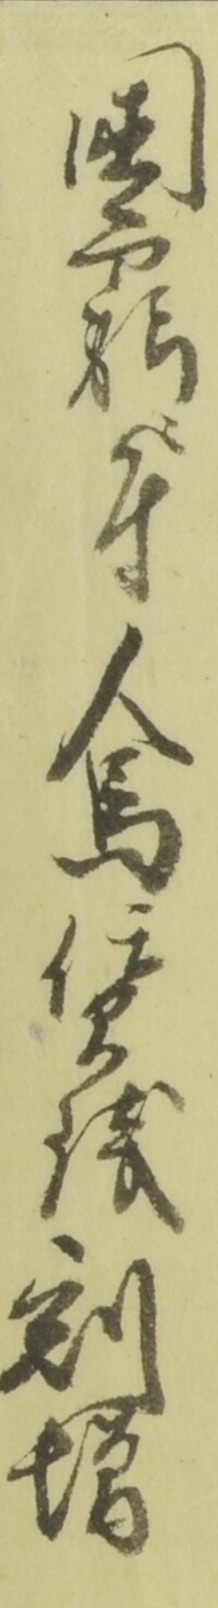困窮ニ付人馬賃銭割増
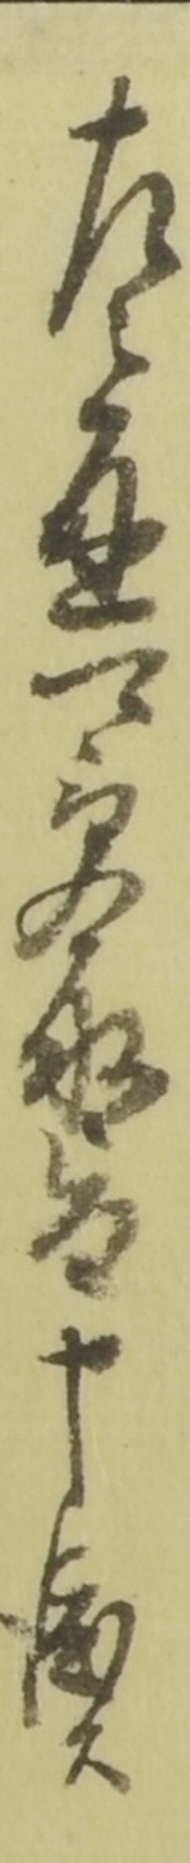左之通可受取旨申渡ス
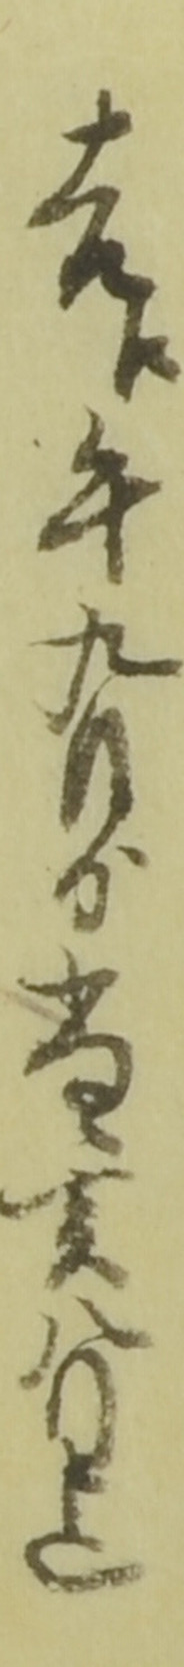去ル午九月ゟ当亥八月迄
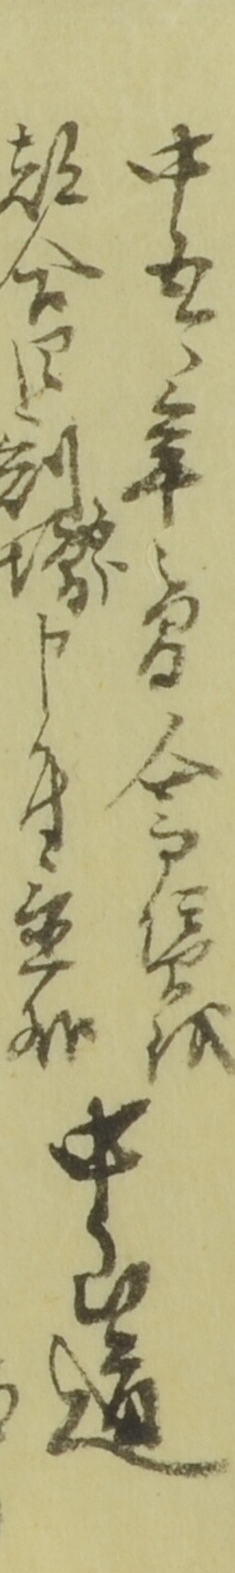都合四割五分増申付置処中山道
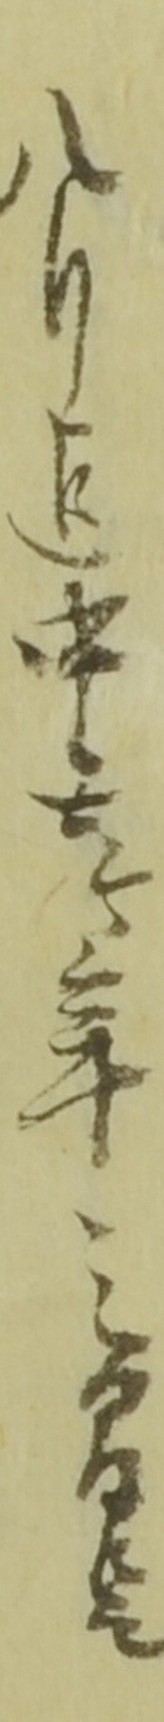八月迄中五ヶ年之間是
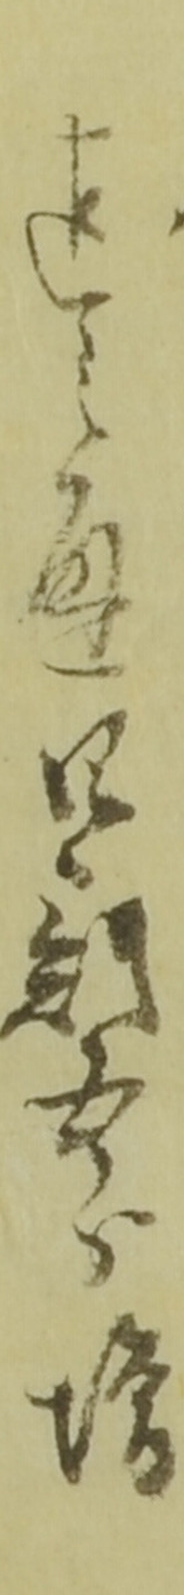迄之通四割五分増
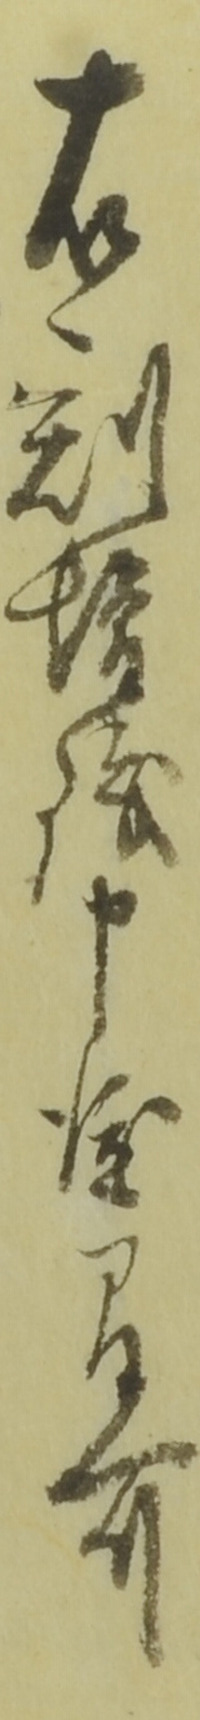右割増銭申渡間可
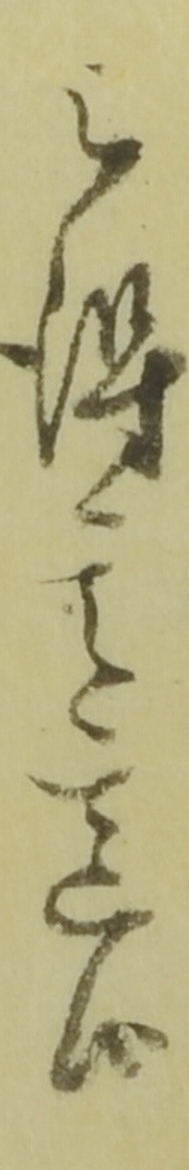被得其意候
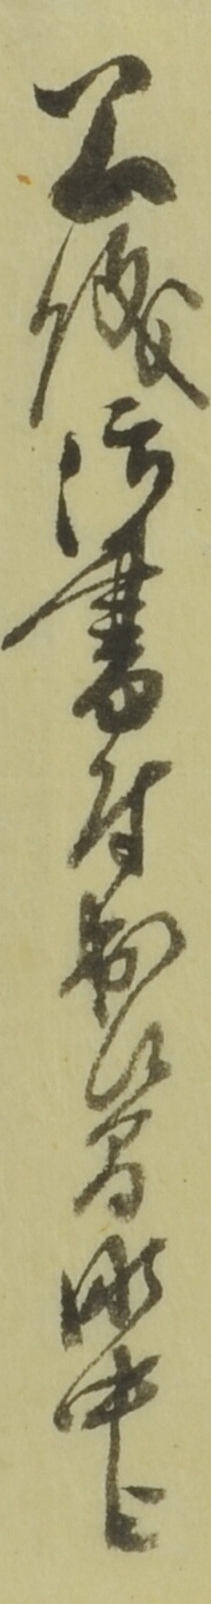公儀御書付出候間町中江
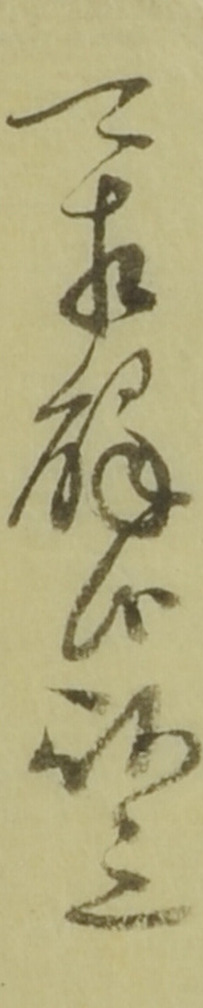可相触候以上
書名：御触書御書附控
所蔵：伊那市立高遠町図書館・合同会社AMANE
